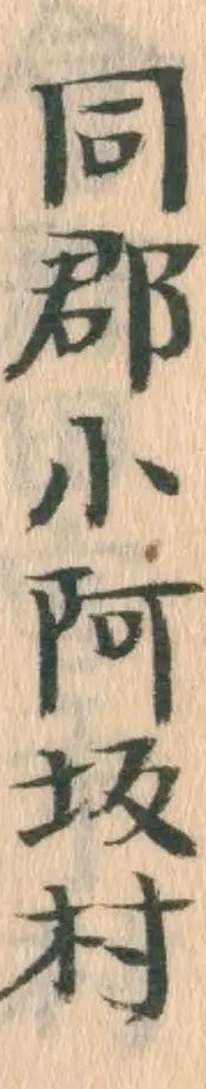同郡小阿坂村
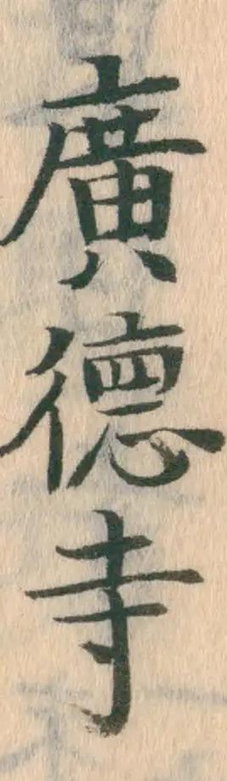広徳寺
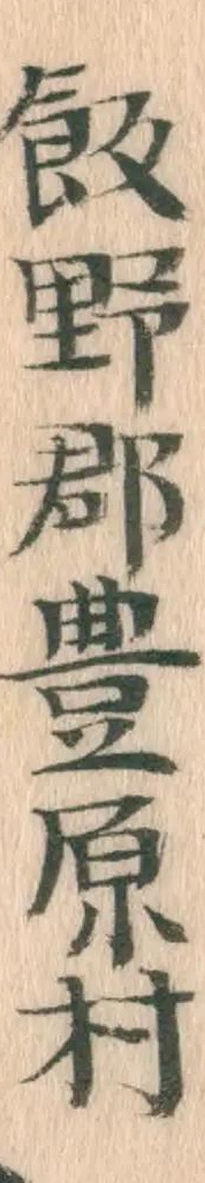飯野郡豊原村
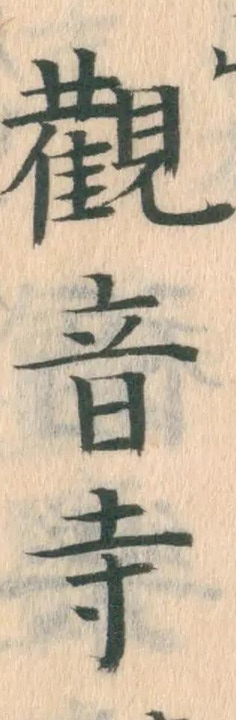観音寺

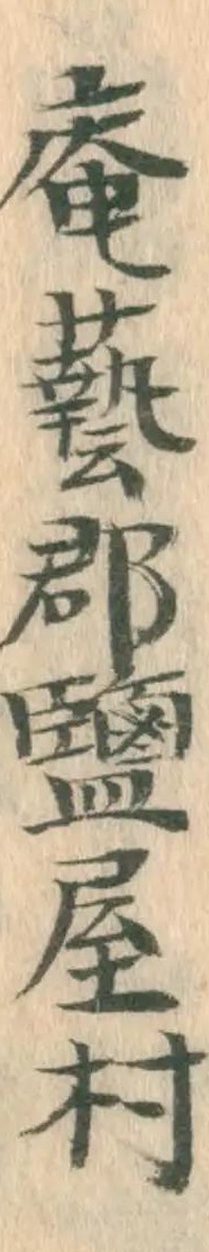庵芸郡塩屋村
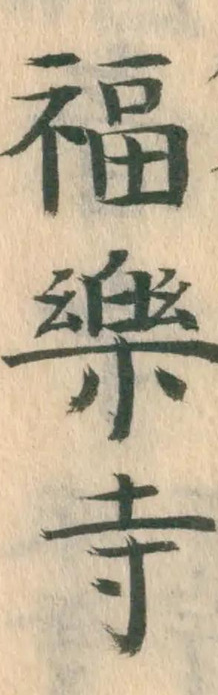福楽寺
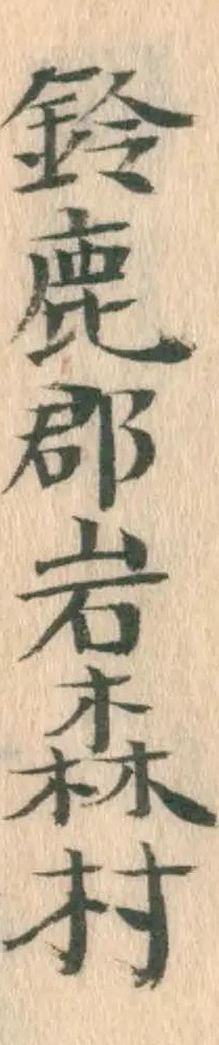鈴鹿郡岩森村
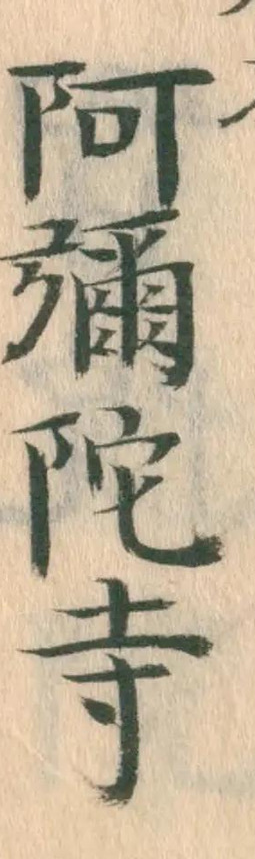阿弥陀寺
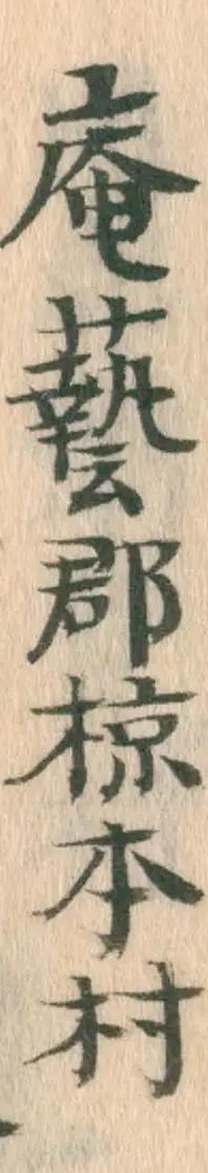庵芸郡塩屋村
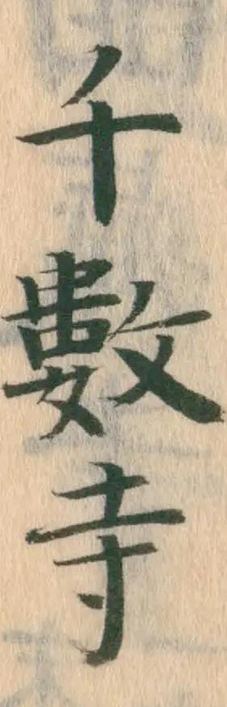千数寺
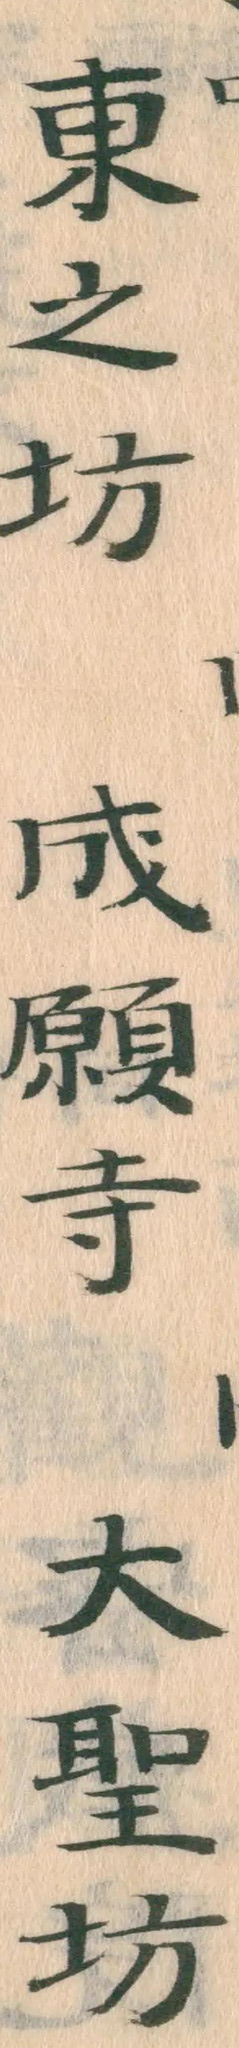東之坊成願寺大聖坊
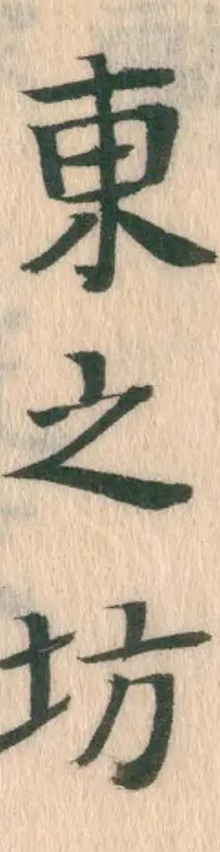中之坊
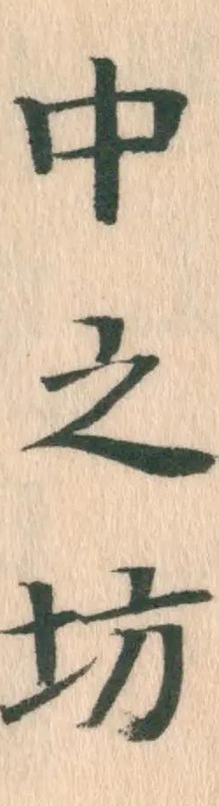中之坊
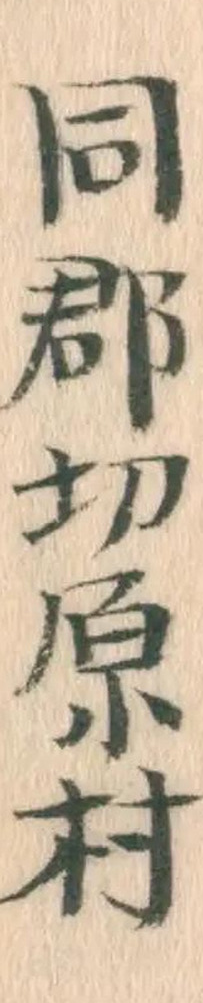同郡切原村
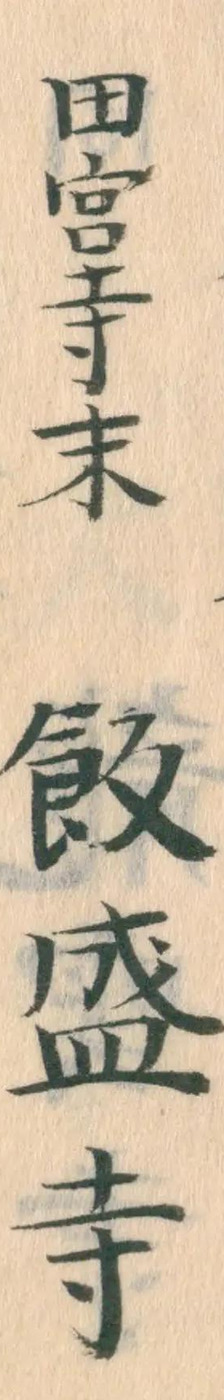田宮寺未飯盛寺

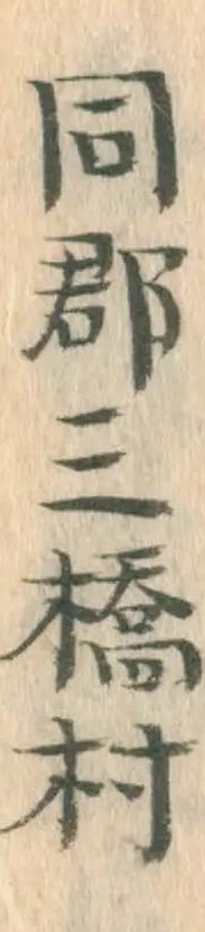同郡三橋村
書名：古義真言宗本末帳 21巻. [4] 第三 伊賀国、伊勢国、志摩国、尾張国、三河国、遠江国、駿河国、伊豆国、甲斐国
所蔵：国立国会図書館 National Diet Library, JAPAN
